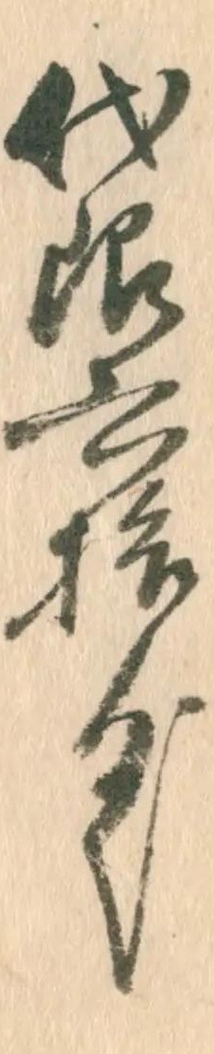代銀六拾匁但壱人銀三匁
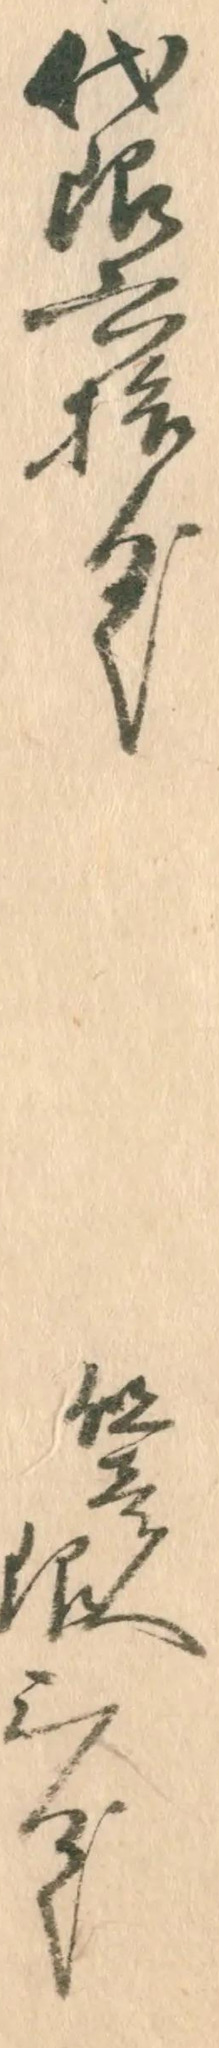代銀六拾匁但壱人銀三匁
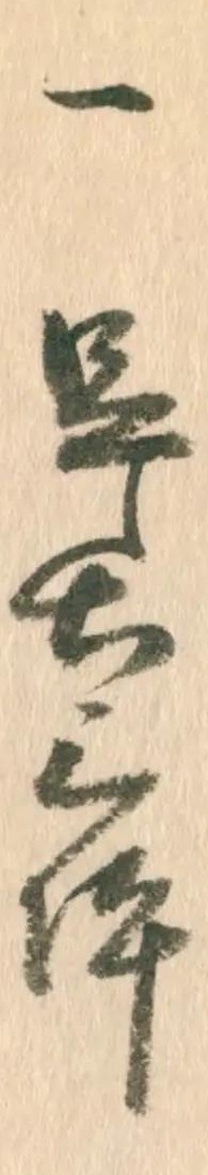一足し土三坪
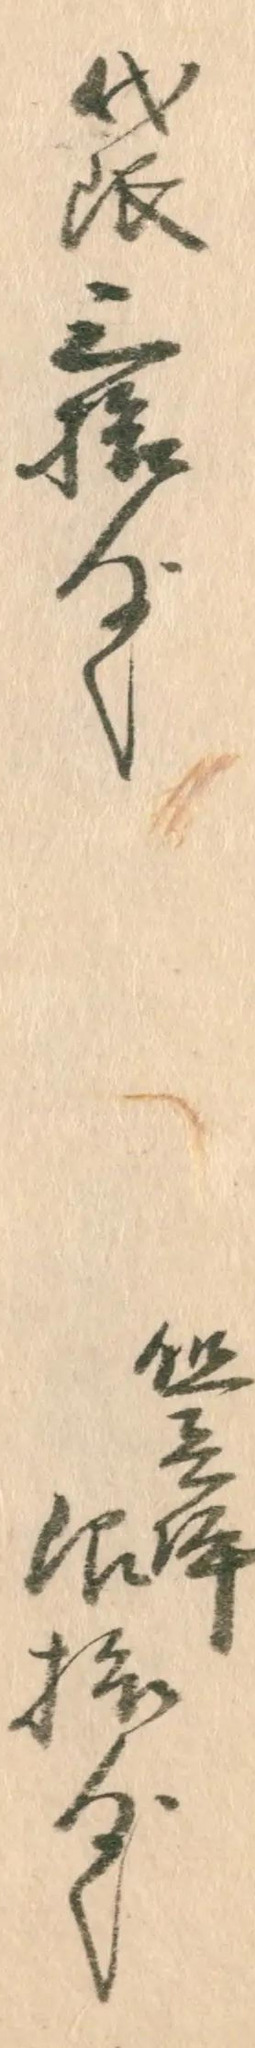代銀三拾匁但壱坪銀拾匁
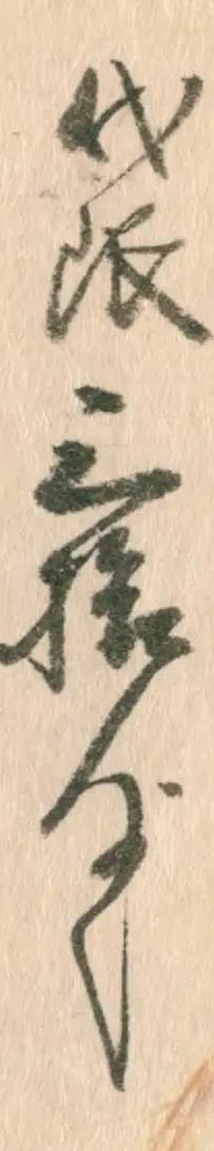代銀三拾匁但壱坪銀拾匁
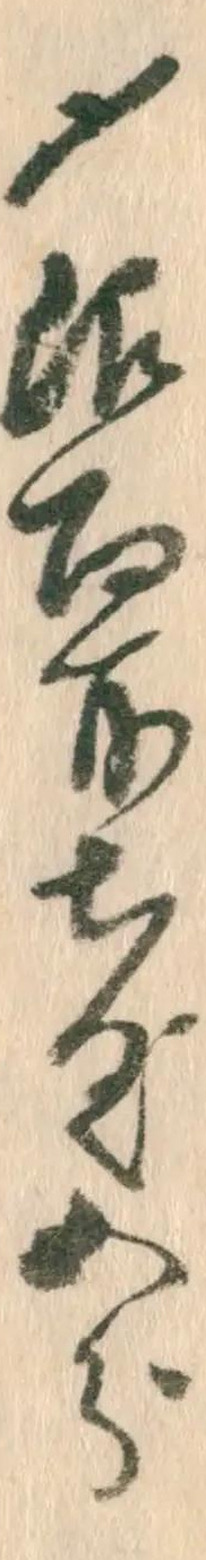〆銀百廿七匁五分
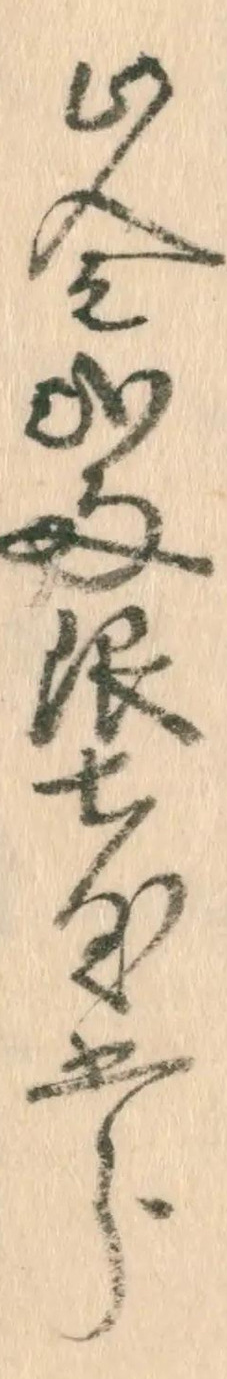此金弐両七匁五分
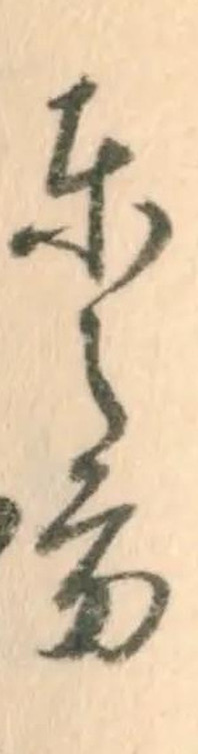東之方
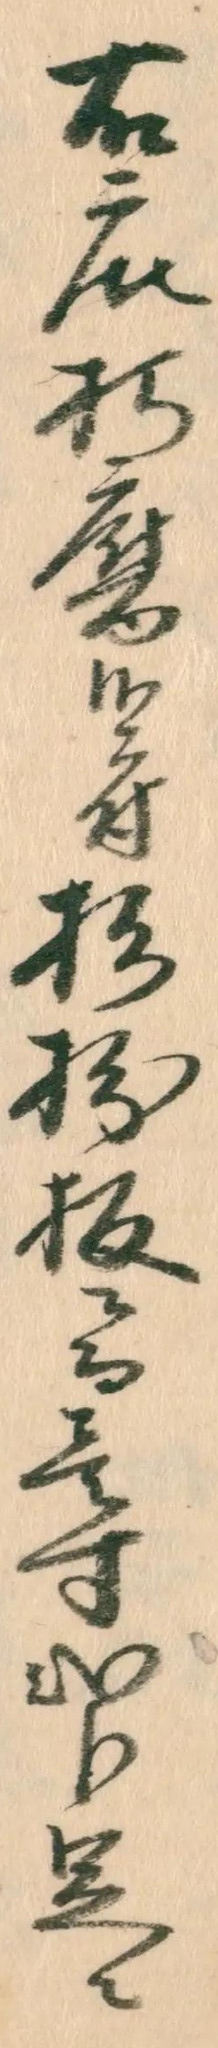右庇朽腐候ニ付杉枌板ニ而壱寸弐分足ニ
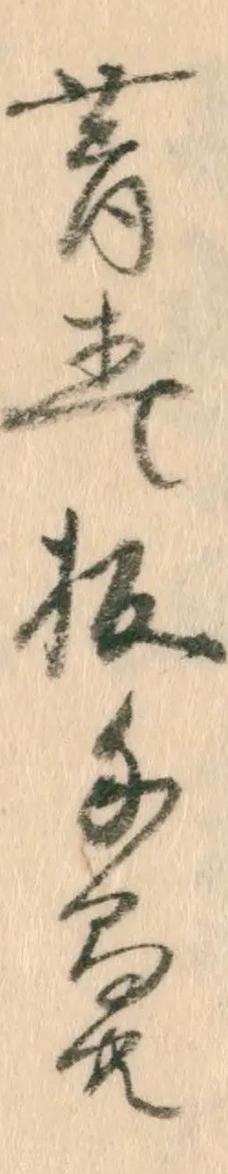葺直し板手間共
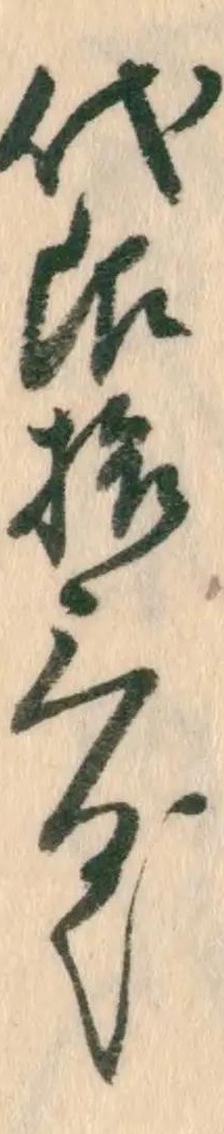代銀拾三匁
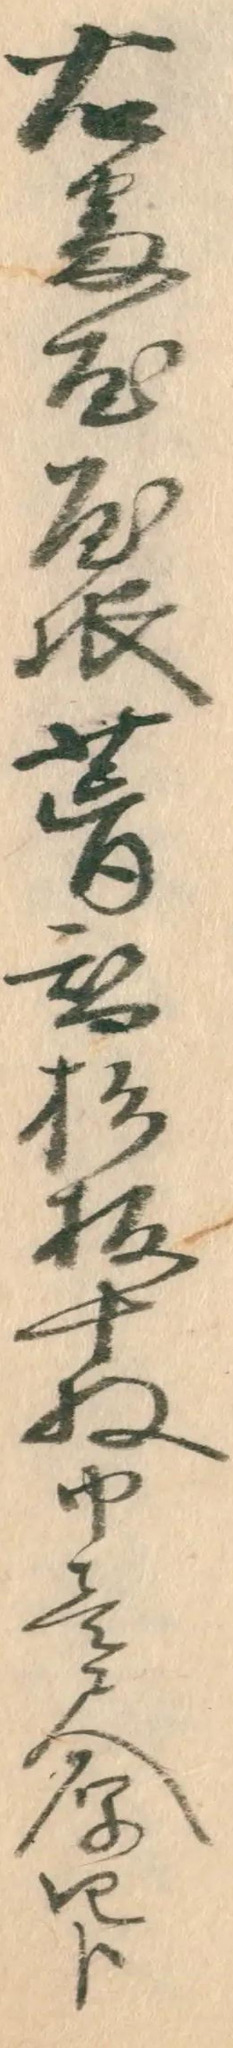右番屋屋根葺替杉板十枚巾壱尺厚四分

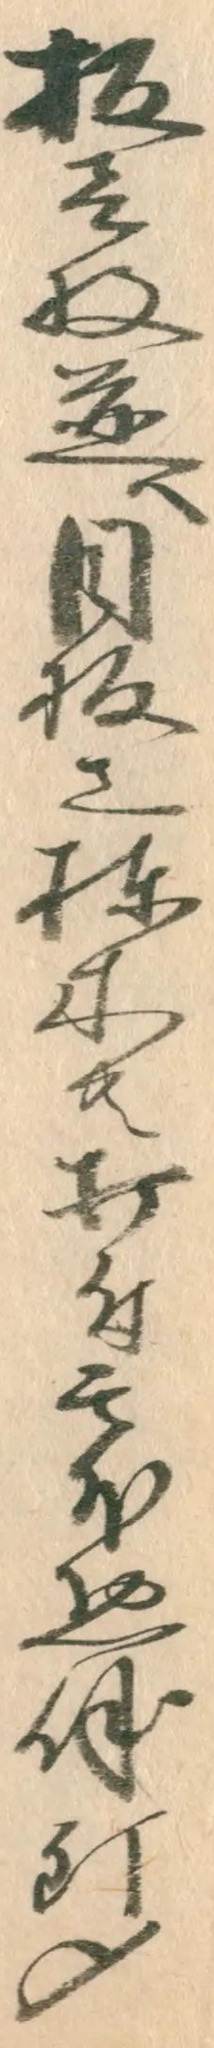板壱枚並へ目板は棟木共打付其外惣体釘〆
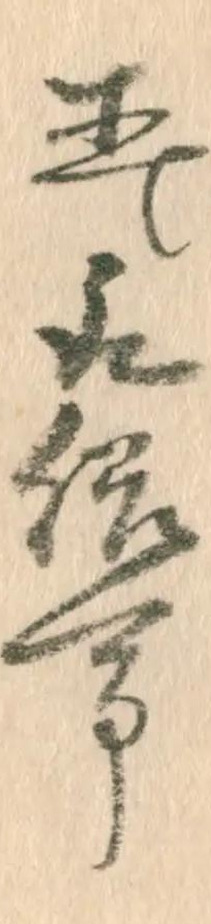直し取繕可申
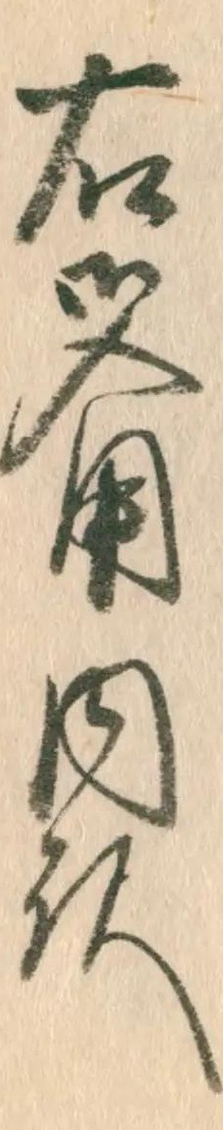右御入用内訳
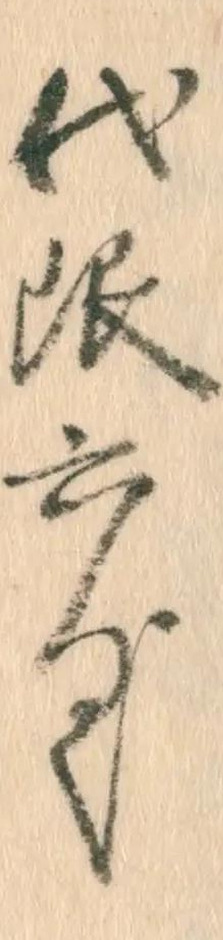代銀五匁
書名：三橋 17巻. [7] 三橋小破御修復書留　但御奉行御掛リ替地震潰橋番屋　嘉永四亥年より安政二卯年迄　上
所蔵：国立国会図書館 National Diet Library, JAPAN
